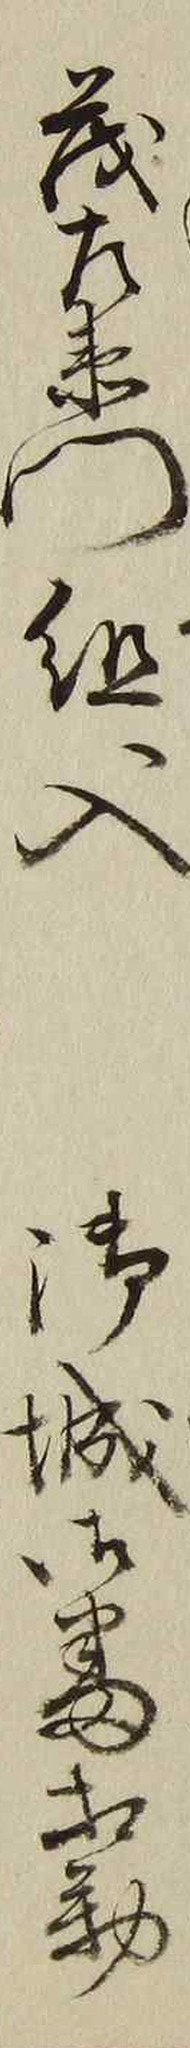茂左衛門組へ入御城御番相勤
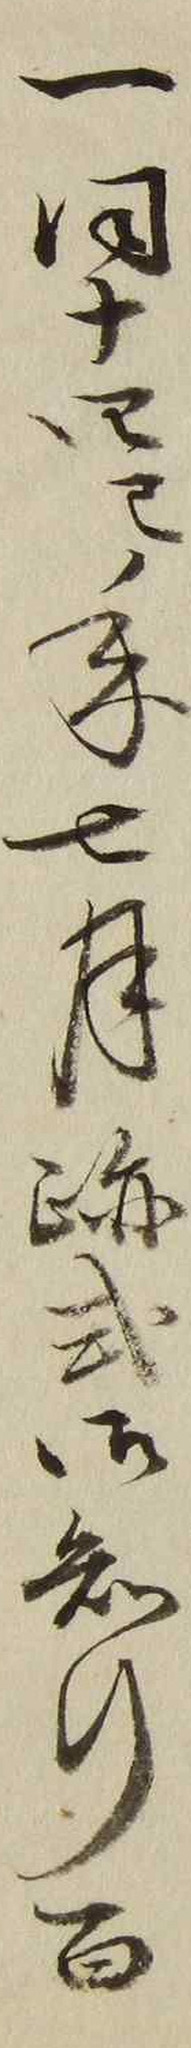一同十四巳年七月跡式御知行百

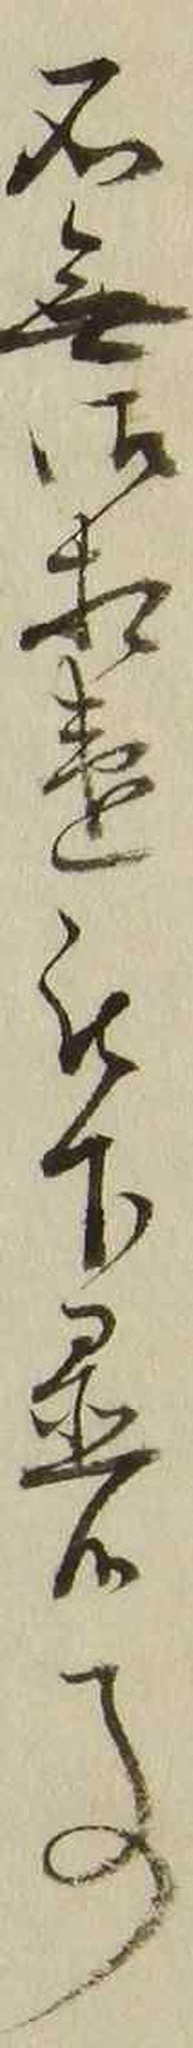石無御相違被下置候事
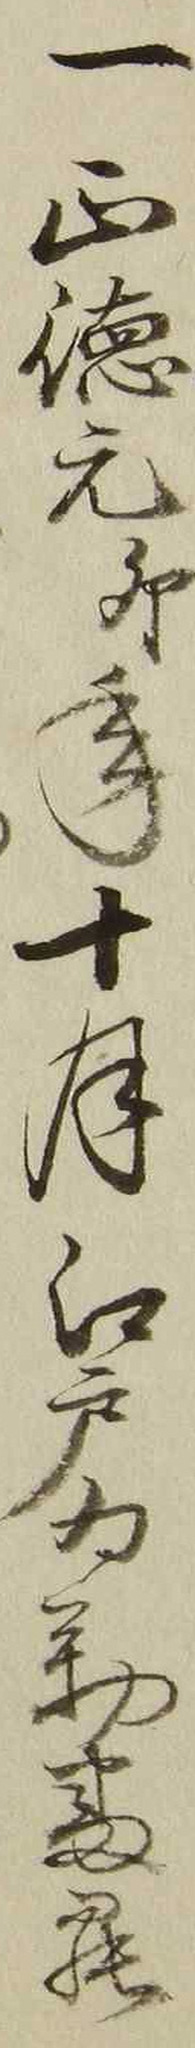一正徳元卯年十月江戸為勤番罷
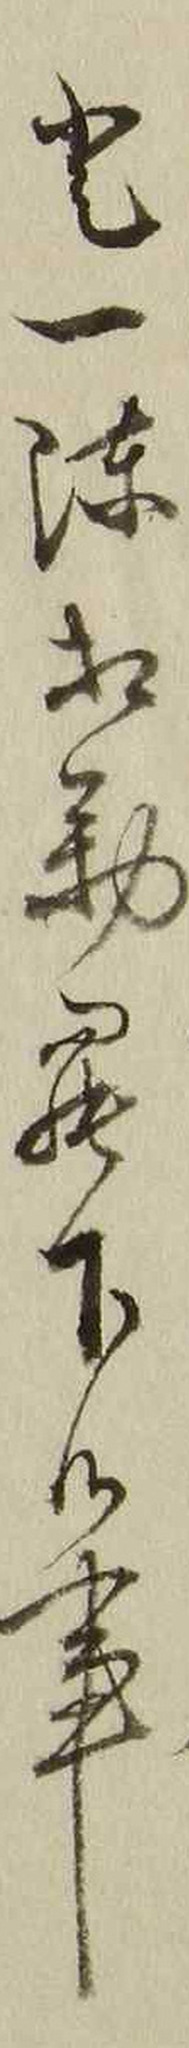登一陳相勤罷下候事
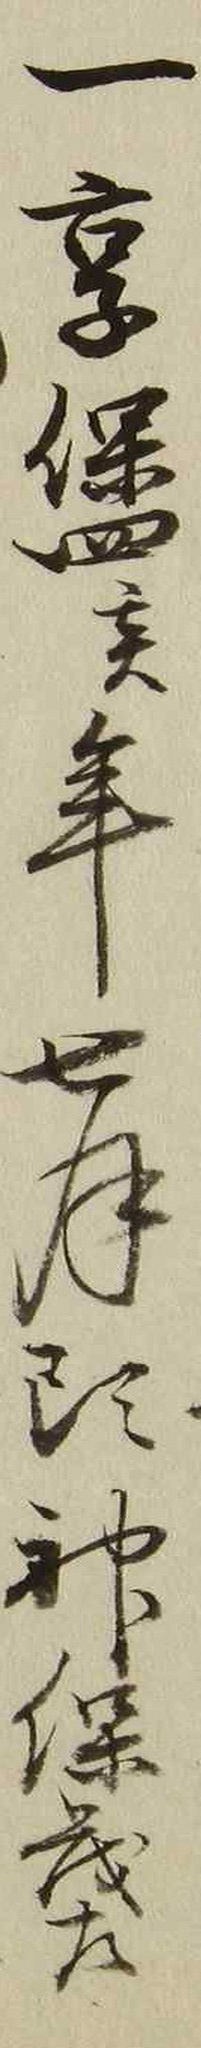一享保四亥年七月頭神保茂左
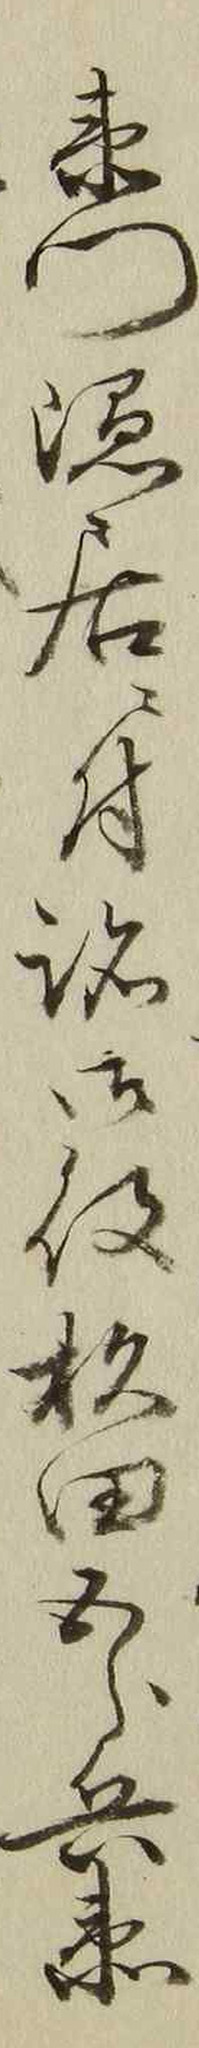衛門隠居ニ付跡御役杉田五郎兵衛
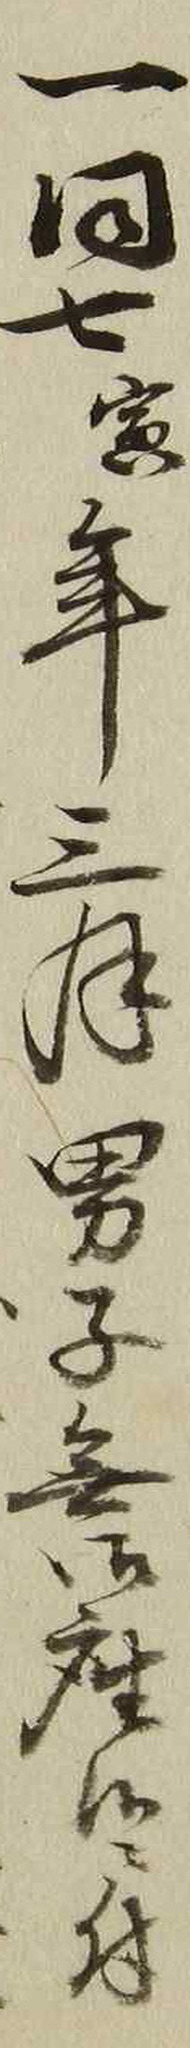一同七寅年三月男子無御座候ニ付
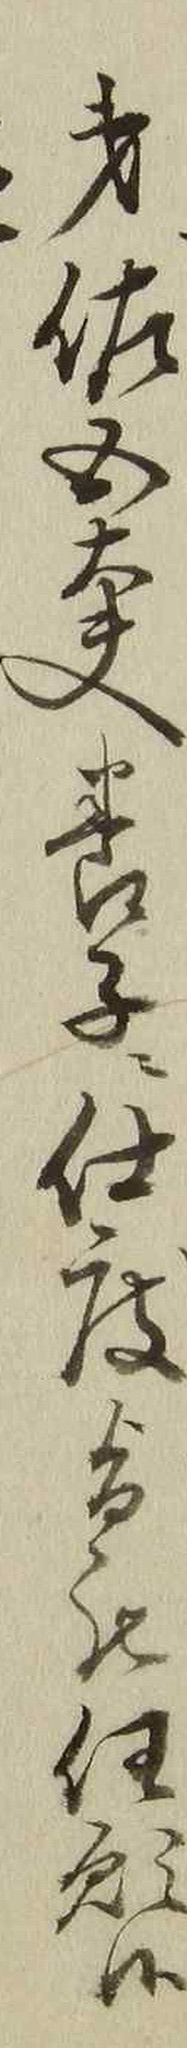弟佐五大夫養子ニ仕度旨被任願候
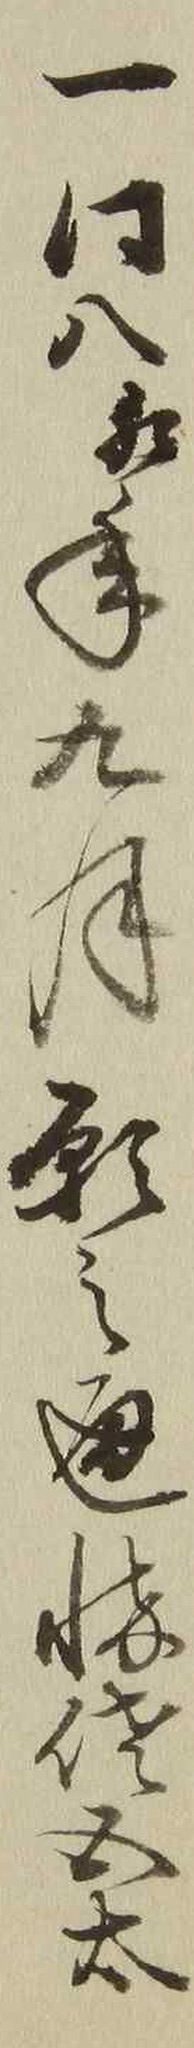一同八卯年九月願之通忰佐五太
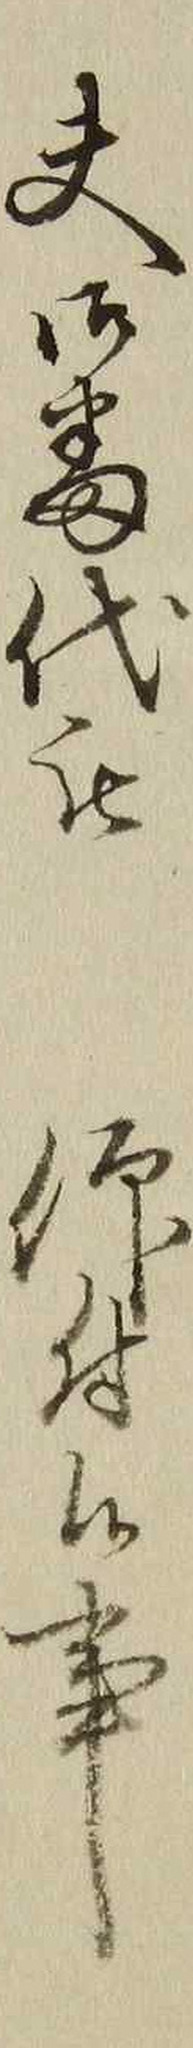夫御番代被仰付候事
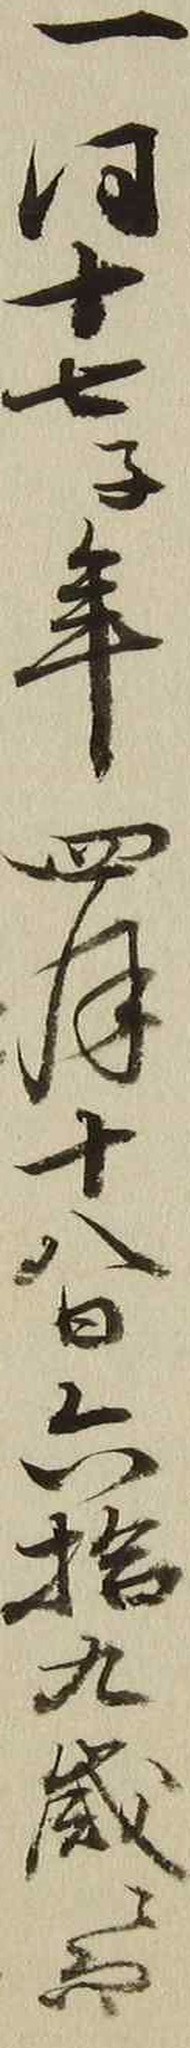一同十七子年四月十八日六拾九歳ニ而
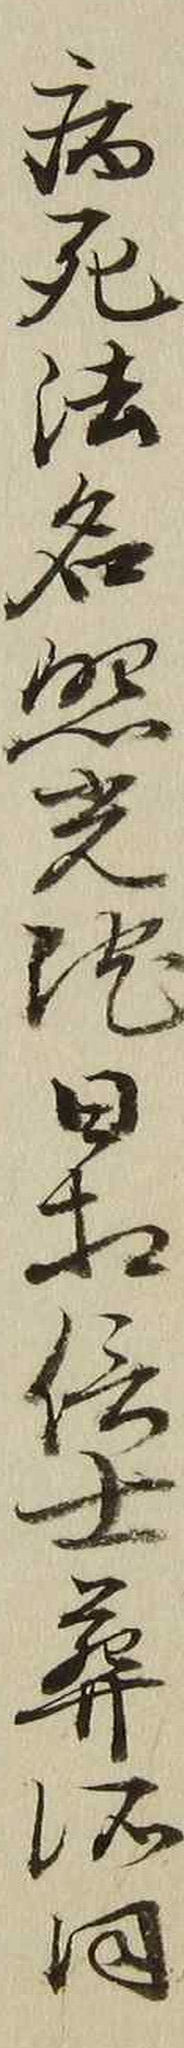病死法名照光院日相信士葬所同
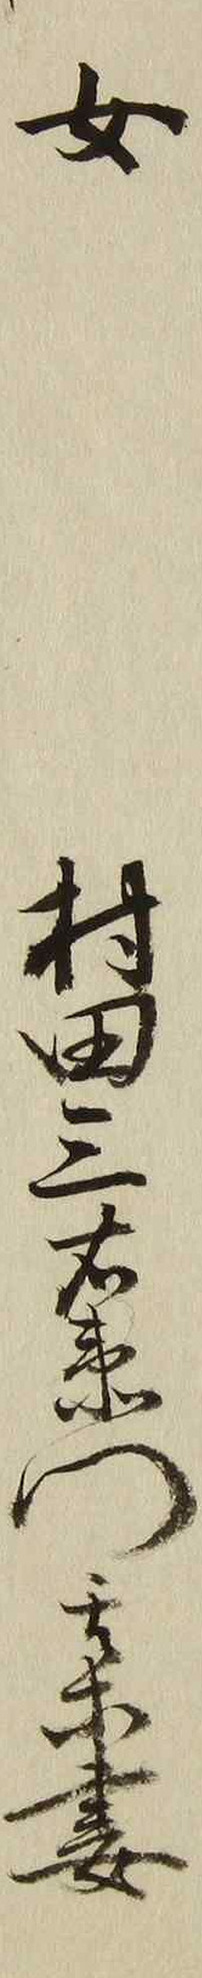女村田三右衛門某妻
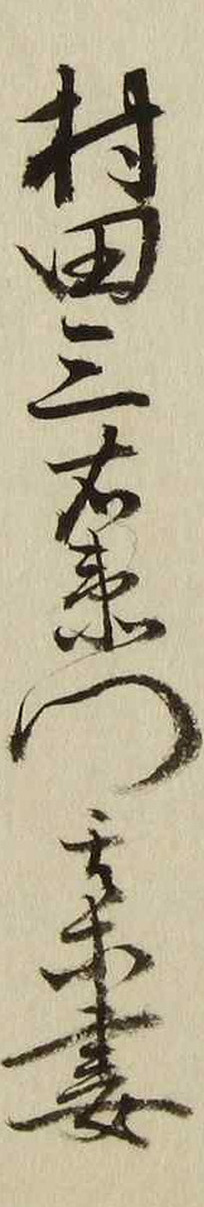女村田三右衛門某妻
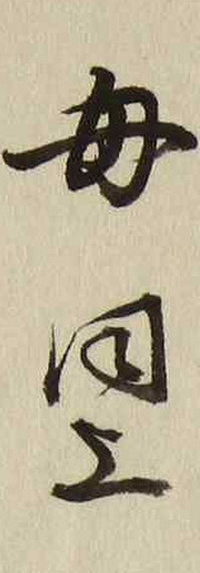母同上
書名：諸士系譜　巻之36　は之部4
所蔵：会津若松市立会津図書館
